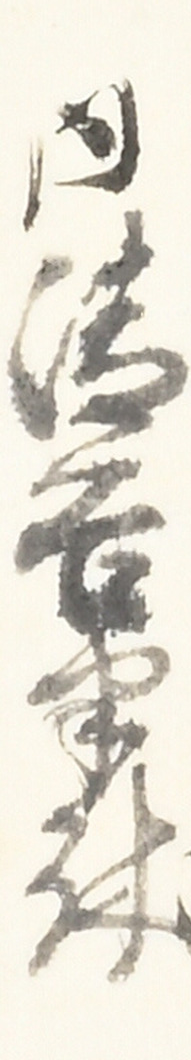内清吉半休

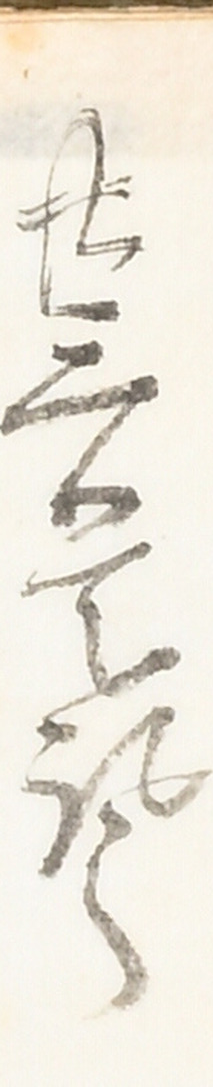廿三日天き也
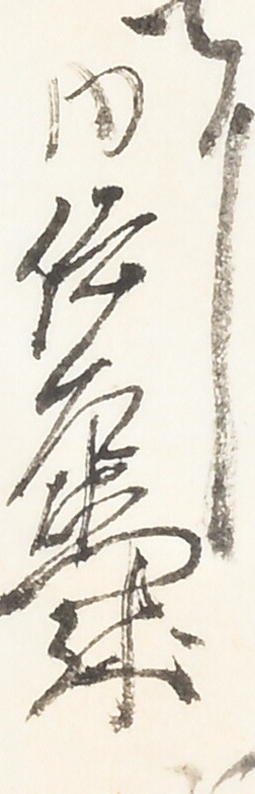内伊左衛門休

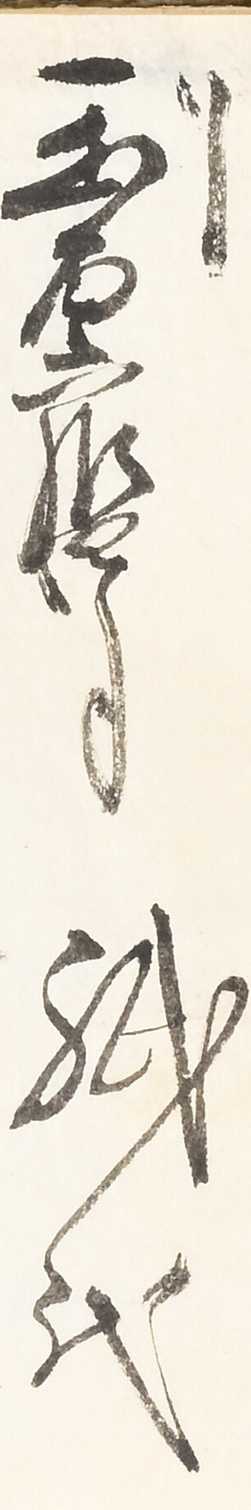一出百六拾四紙代
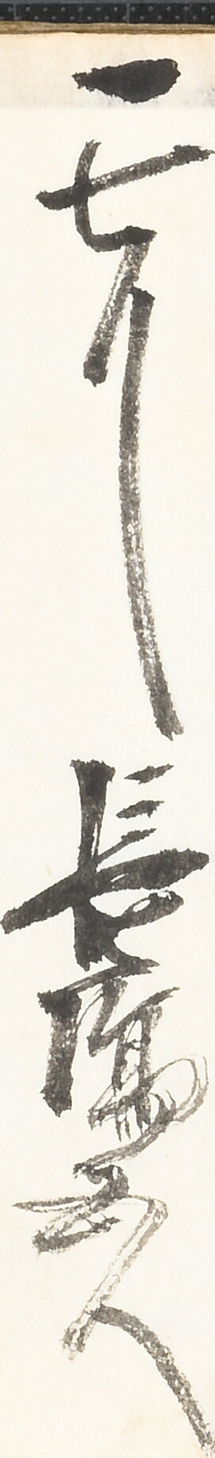一七人長橋五人

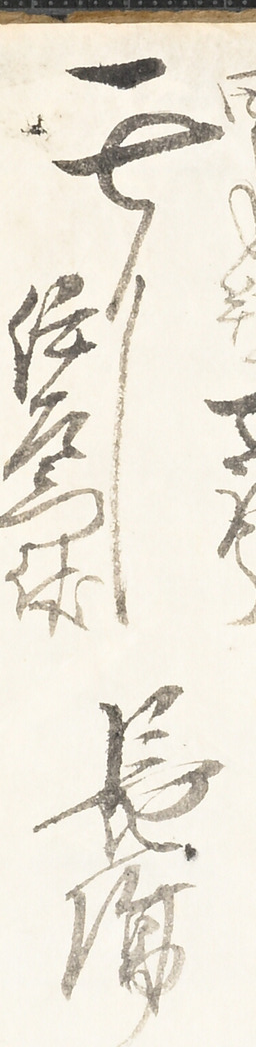伊左衛門休

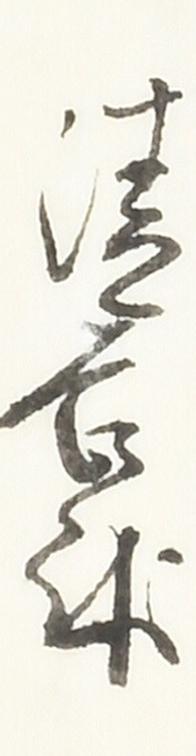清吉休

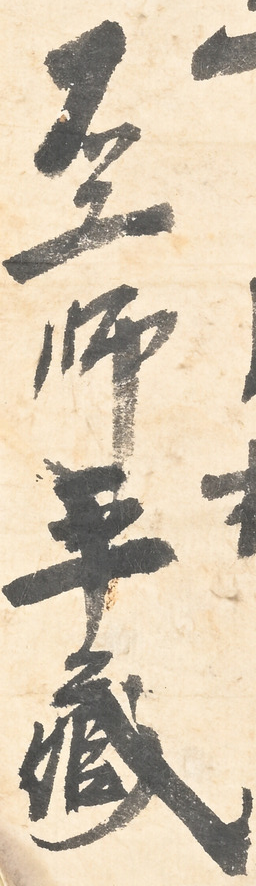石工師平蔵
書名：天保十巳癸（亥）年正月大吉祥日萬日記控帳
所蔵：伊那市立高遠町図書館・合同会社AMANE
